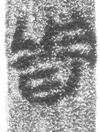周
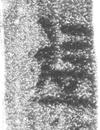者
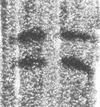二
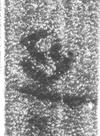足
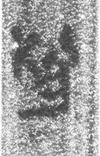桱
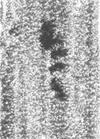屯
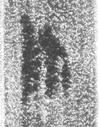彫（雕）
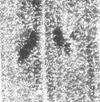八
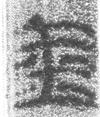金
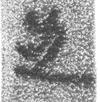足
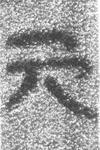亓（其）
